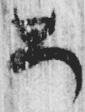也
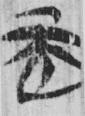而
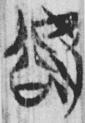欲
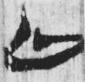㠯（以）
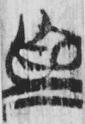爲
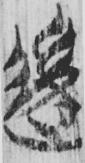後
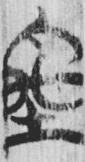○（禹）
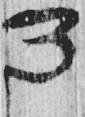乃
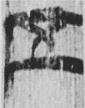五
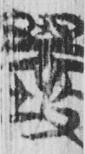襄（讓）
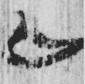㠯（以）
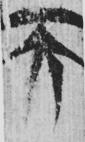天
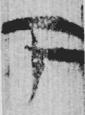下
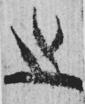之
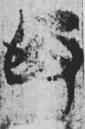臤（賢）
